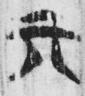亓（其）
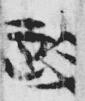政
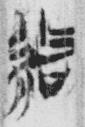紿（治）
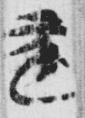而
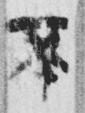不
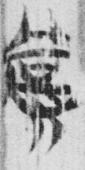賞
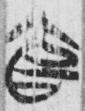官
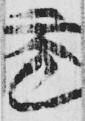而
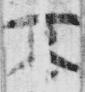不
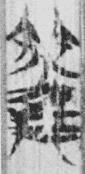○（爵）
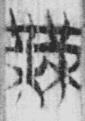無
